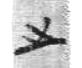之
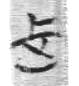上B（上）
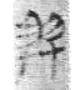與
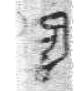𫺕
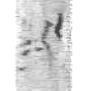哲
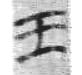王
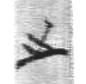之
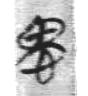愄（威）
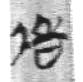俈
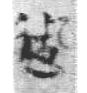{辶卜}
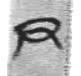尹
